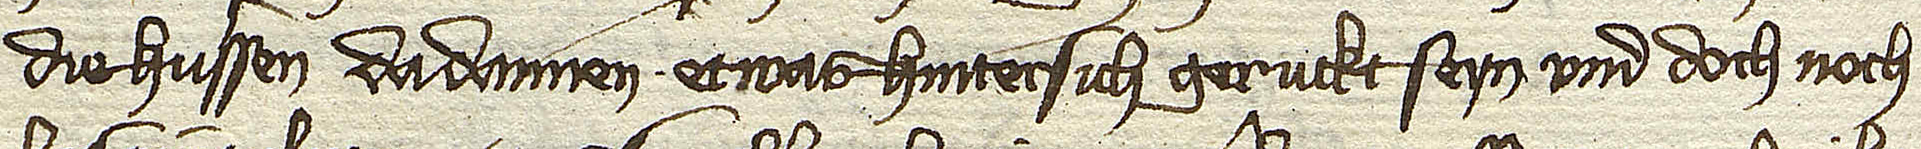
die huſſen da dannen . etwas hinterſich geruckt ſeyn vnd doch noch
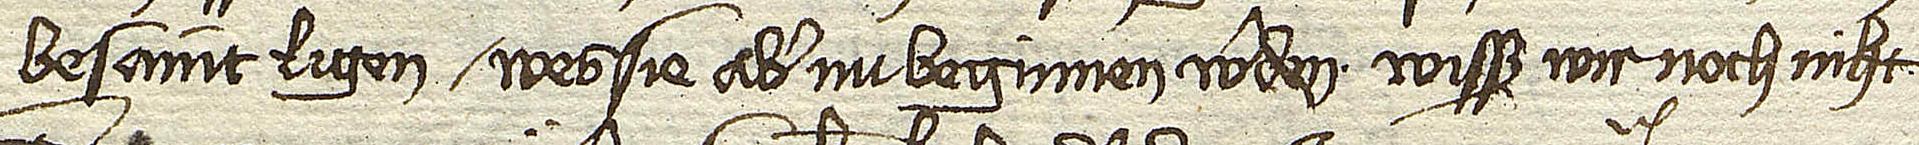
beſamt* ligen / wes ſie ab* nu beginnen w*den . wiſſ* wir noch niht
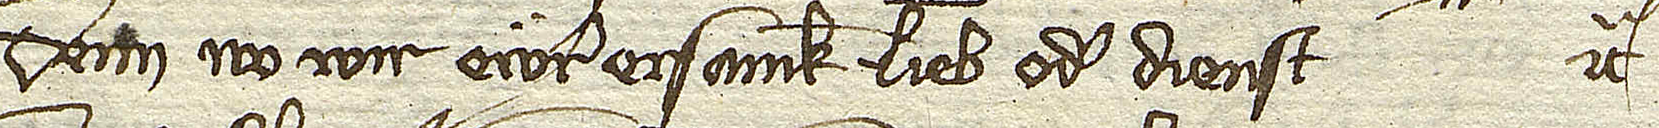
Denn wo wir ew*r erſamk* lieb od* dienſt ec*
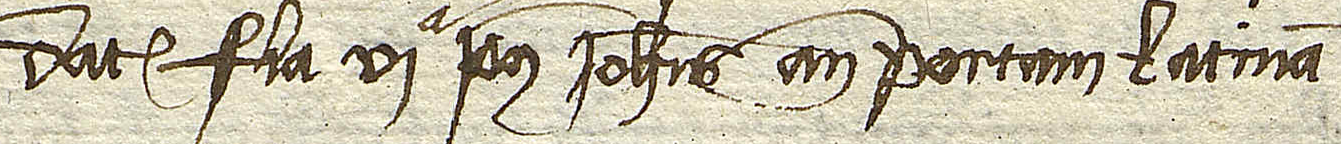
Dat* fia* vi* p* Ioh*is an* portam latina*
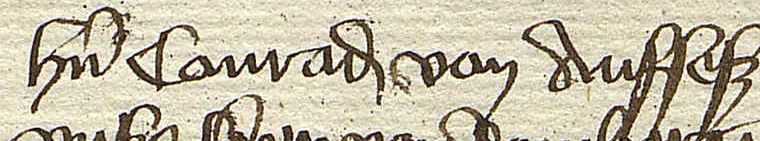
H*n Conrad* von Aufſeſʒ
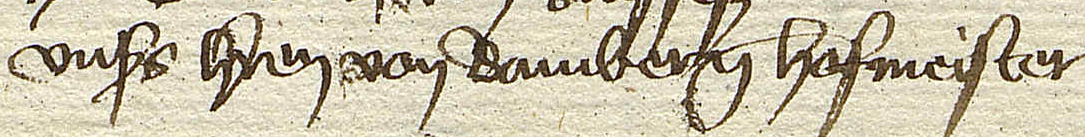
vnſ*s h*ren von Bamberg hofmeiſter
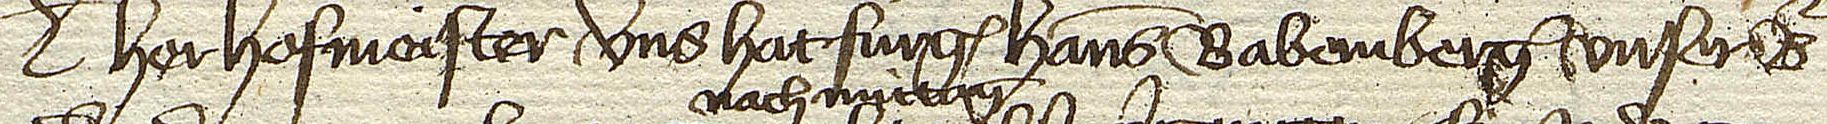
L* her hofmeiſter / Vns hat fürg* hans* Babemberg* vnſer B*
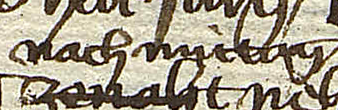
nach mittag
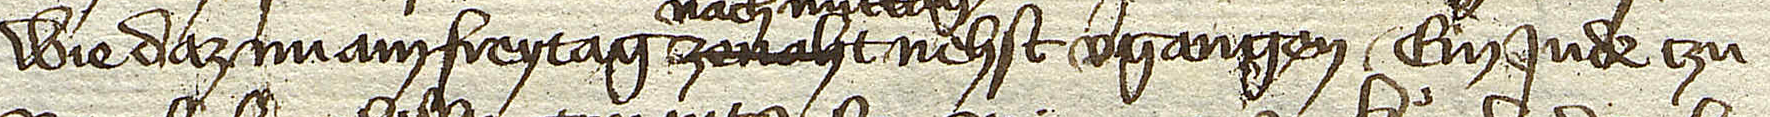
Wie daʒ nu am freytag ʒenaht nehſt v*gangen / Ein Iude cʒu
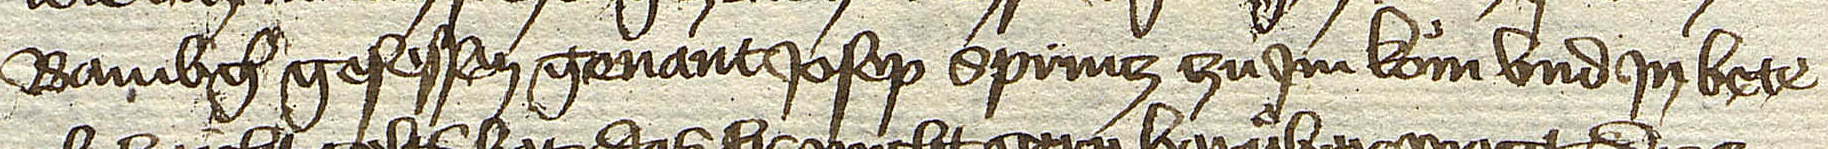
Bamb*g geſeſſen genant Ioſep Sprincʒ cʒu Im köm vnd In bete
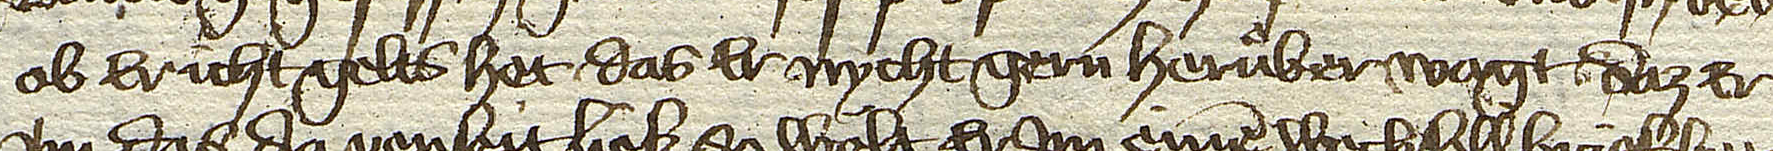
ob Er icht gelts het / das Er nycht gern herüber wagt / daʒ Er
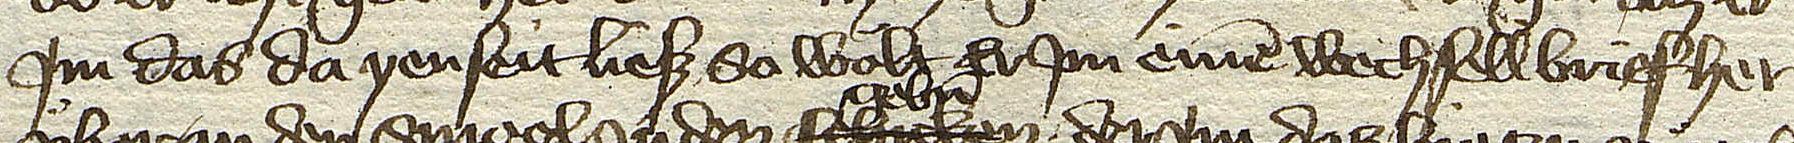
Im das da yenſeit lieſʒ so wölt Er Im eine* wechſellbrief her
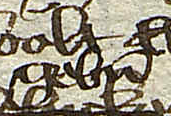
geb*n
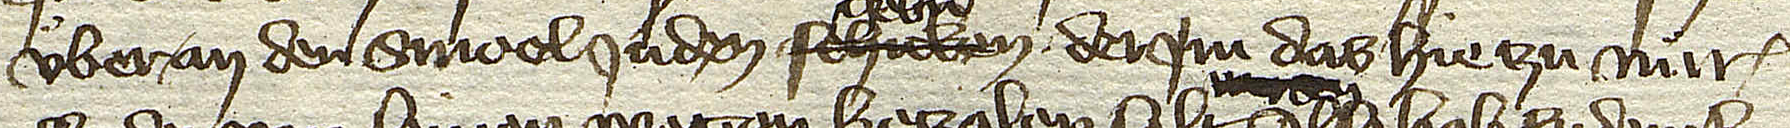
v̈ber an den Smoel Iuden ſchicken . der Im das hie cʒu Nür*
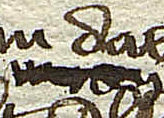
werden
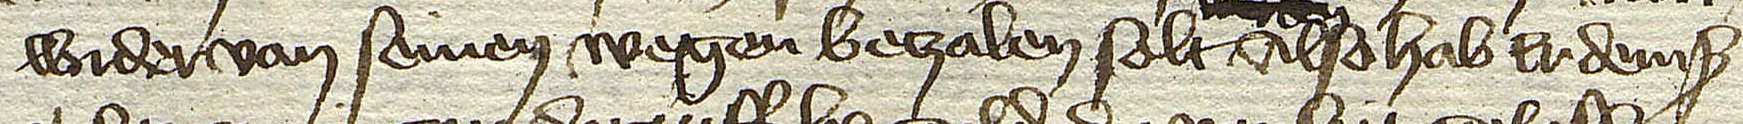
wider von ſeinen wegen becʒalen ſolt / Alſo hab Er demſ*
